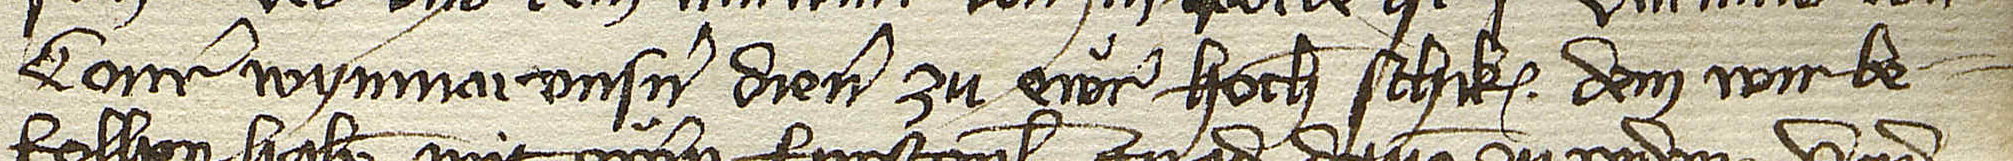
Conr* wynmar vnſ*n dien* ʒu ewr* hoch* ſchik* . dem wir be =
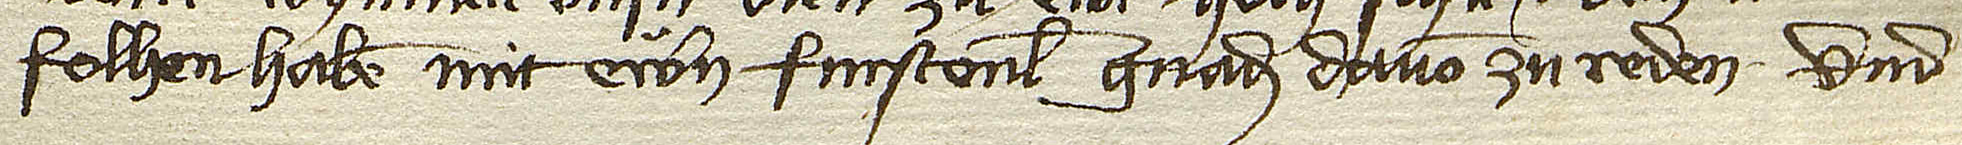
folhen habe* mit ew*n furſtenl* gnad* dauo* ʒu reden . Vnd
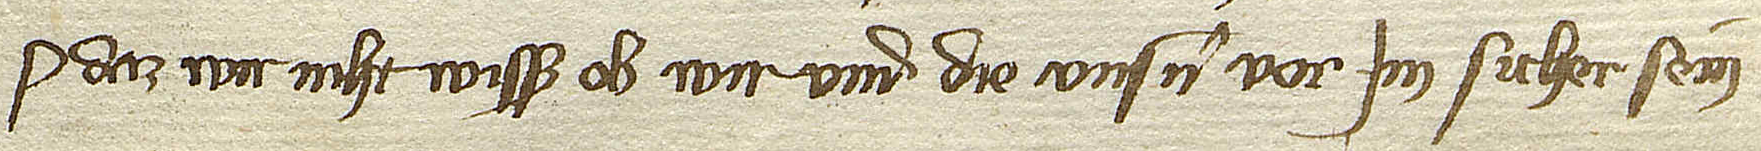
daʒ wir niht wiſſ* ob wir vnd die vnſn* vor Im ſicher ſein
